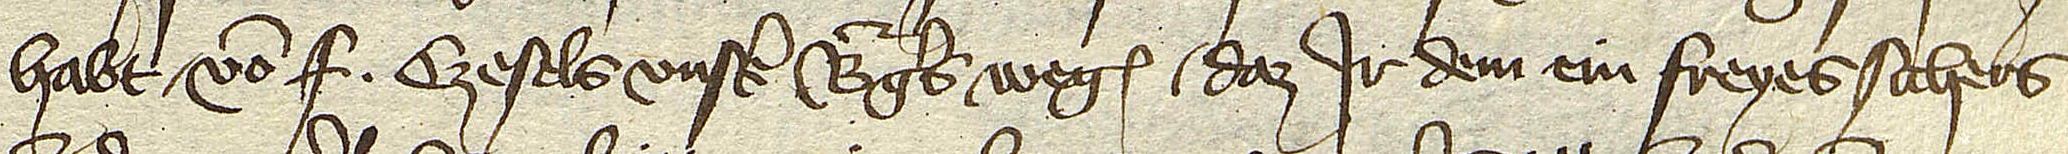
habt / vo* F . Cʒeſels vnſs* B*g*s weg* / daʒ Ir dem ein freyes ſichers
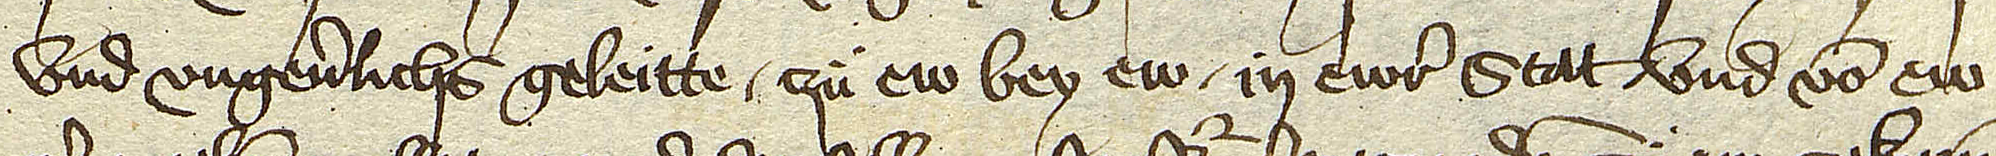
vnd vngeu*lichs geleitte / cʒü ew bey ew / in ewr* Stat / vnd vo* ew
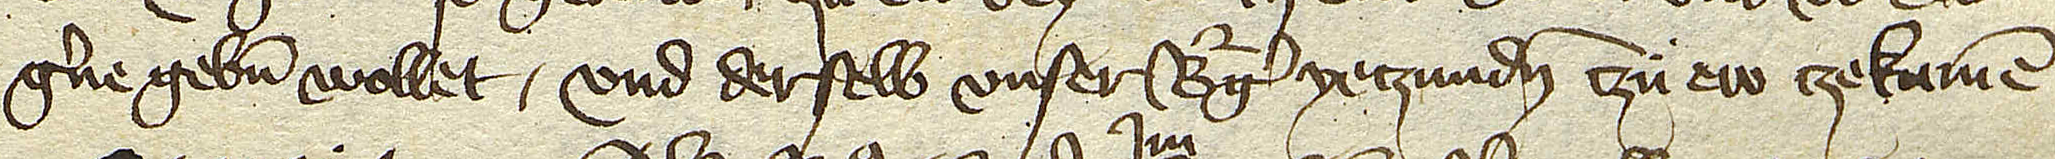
g*ne gebn* wollet / vnd derſelb vnſer B*g* yecʒundn* cʒü ew cʒekume*
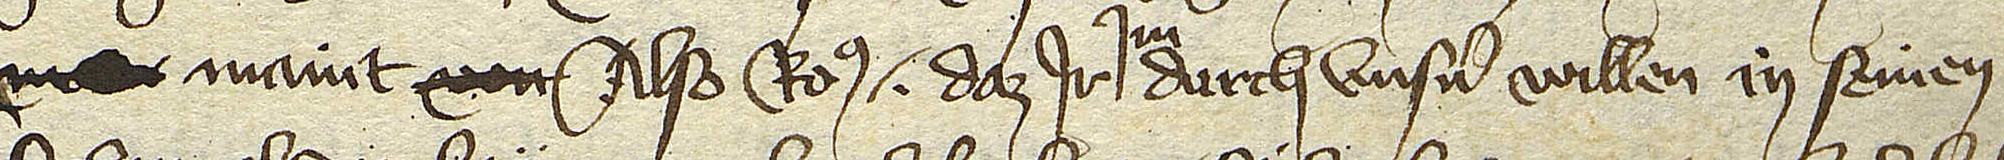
m%% maint von Alſo Ro* / . daʒ Ir durch vnſn* willen in ſeinen
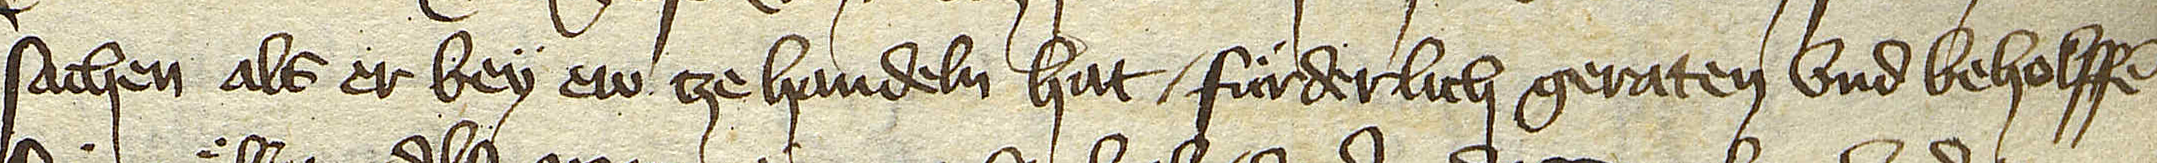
ſachen als er bey ew cʒe handeln hat / fürderlich geraten vnd beholffe*
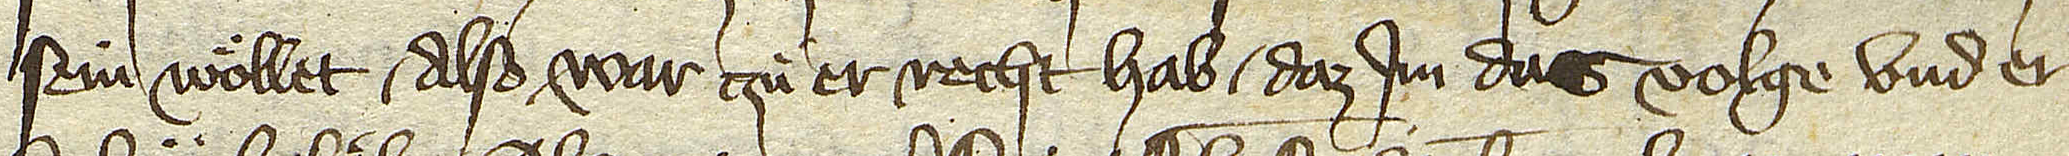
ſein wöllet / Alſo war cʒü er recht hab / daʒ Im das volge vnd er
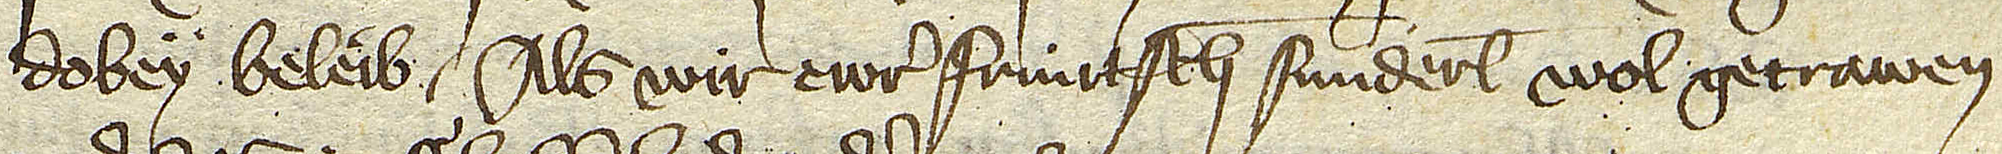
dobey beleib / Als wir ewr* fruntſch* ſunderl* wol getrawen
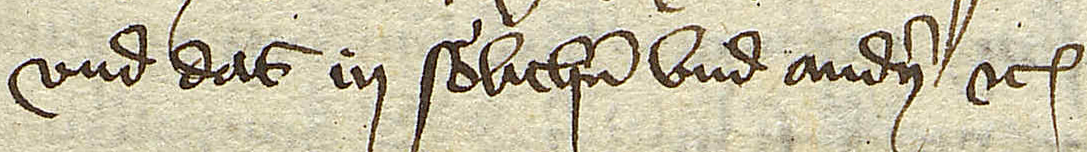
vnd das in ſölichn* vnd andn* ec*
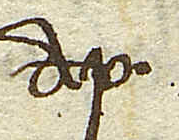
Ap .
